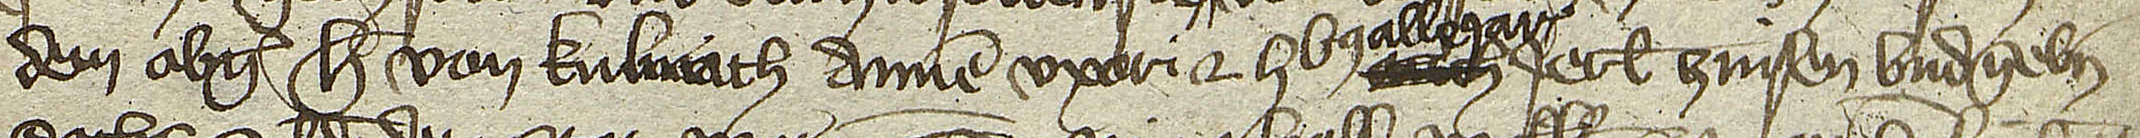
dem obg* H* von kulmach Anne* vxari @ h* auch Ierl* cʒinſen vnd gebn*
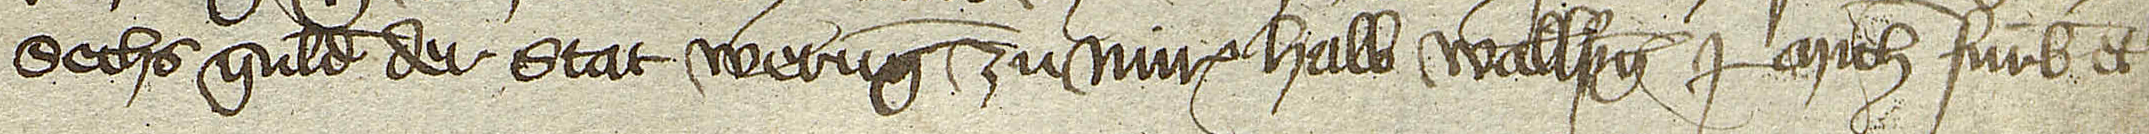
Sechs guld* der Stat werug* cʒu Nur* halb wallpg* i Mich* fürb* ec*
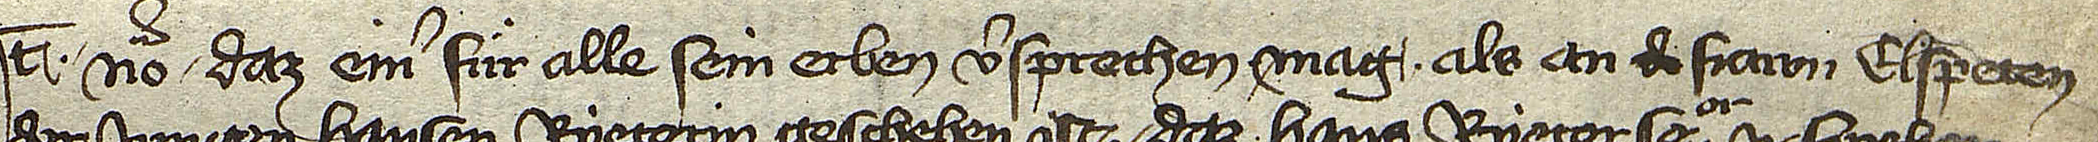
It* / no* / daʒ ein* für alle ſein erben v*ſprechen mag / . als an d frawn Elſpeten
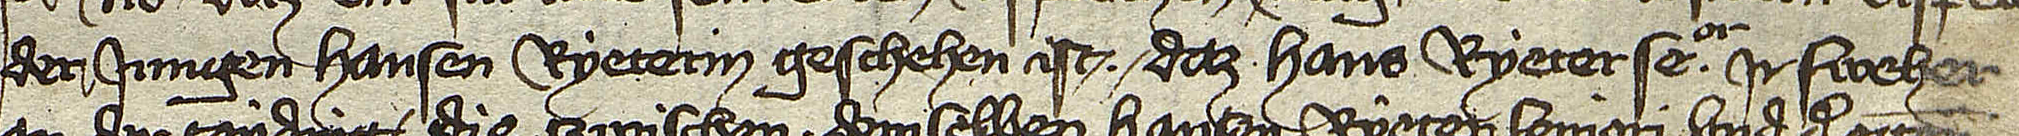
der Iungen hanſen Ryeterin geſchehen iſt / . / daʒ hans Ryeter ſe* . Ir ſweher
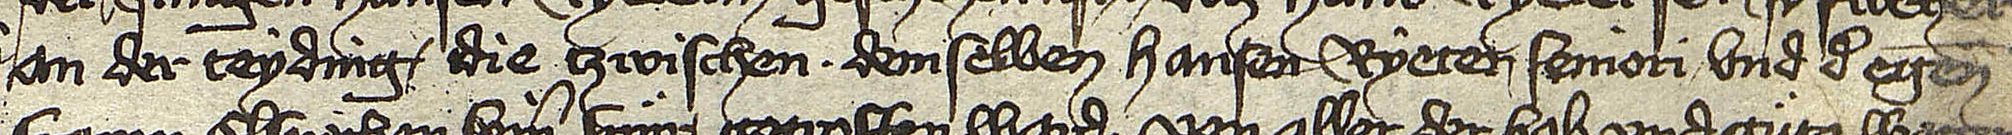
an der teyding / die cʒwiſchen . demſelben hanſen Ryeter ſeniori vnd d* egen*
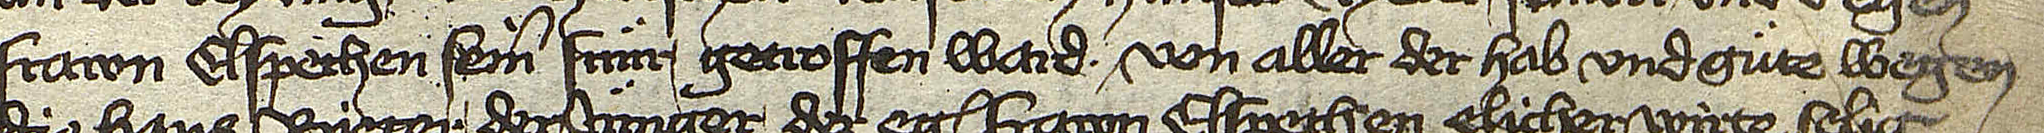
frawn Elſpethen ſein* %%%% getroffen ward . von aller der hab vnd güte wegen
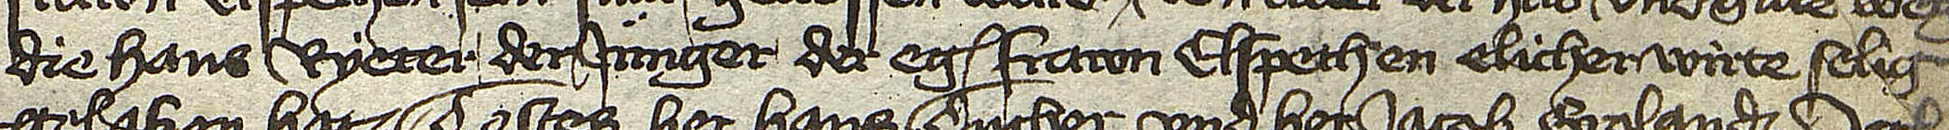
die hans Ryeter der Iünger der eg* frawn Elſpethen elicher wirte ſelig
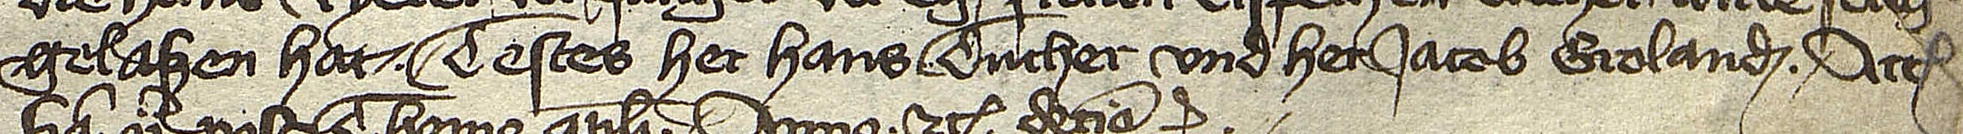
gelaſʒen hat / . / Teſtes her hans Tucher vnd her Iacob Groland . Act*
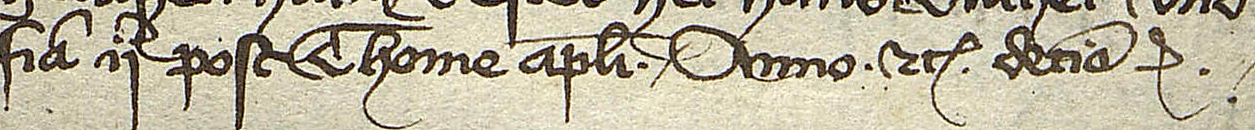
fia* ii* poſt Thome apli* . / Anno . ec* . decio* § . /
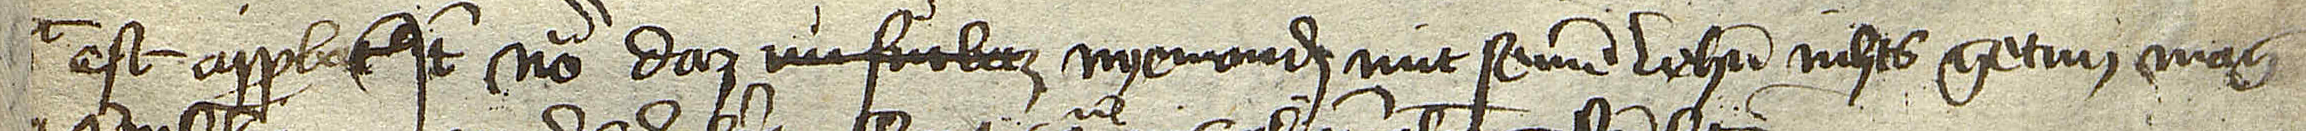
h* eſt appbat* It* no* daʒ nü fürbaʒ nyemand* mit ſeine* lehn* nihts getun mag
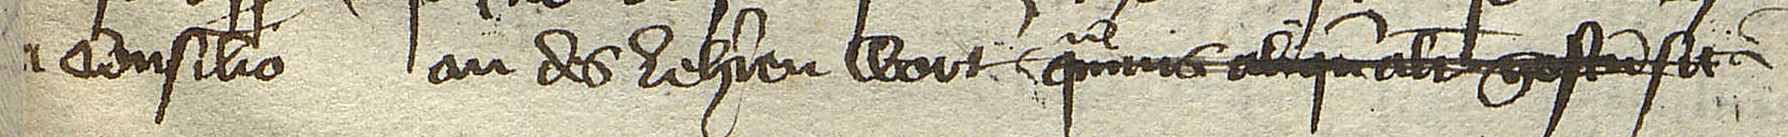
%% Conſilio an des lehren* wort / quuis* aliqu* alr* goſtu* ſic*
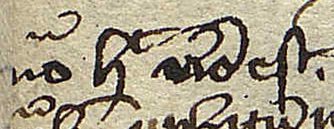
no* h* no* eſt .
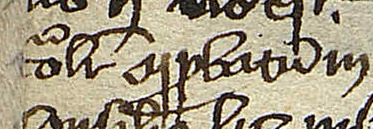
tolr* appatn* in
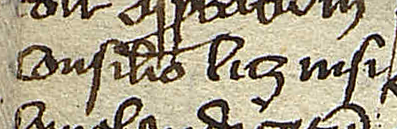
Conſilio* l%% niſi
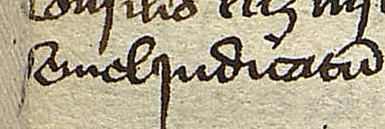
ſemel Iudicatn*
